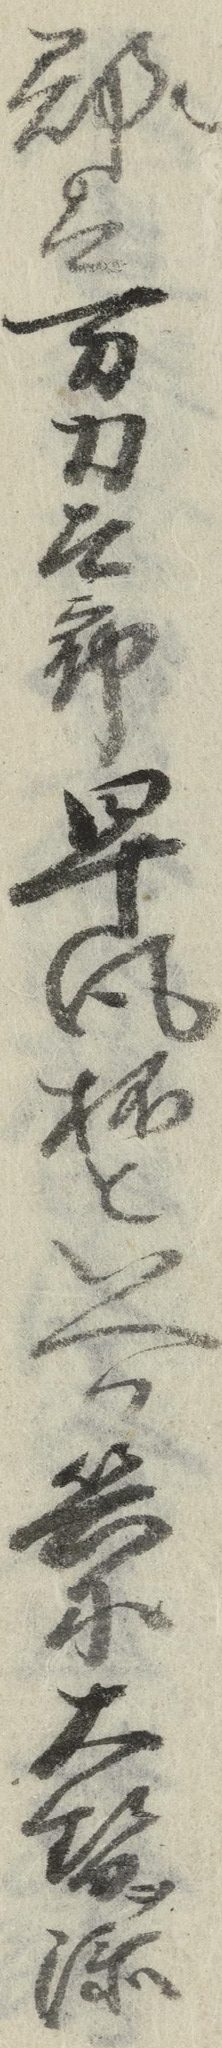郡は万力太郎早風抔といへる筈に大勢添
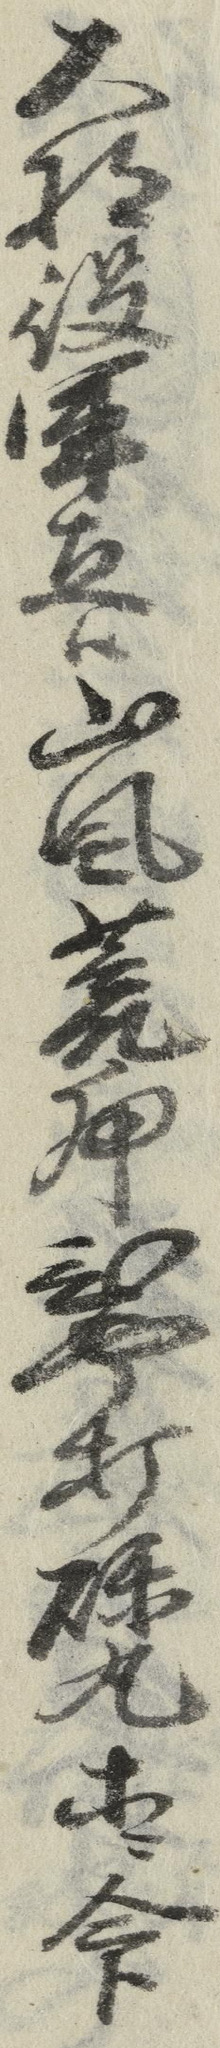大将役軍立ハ山風荒神ひや打硃丸等に命
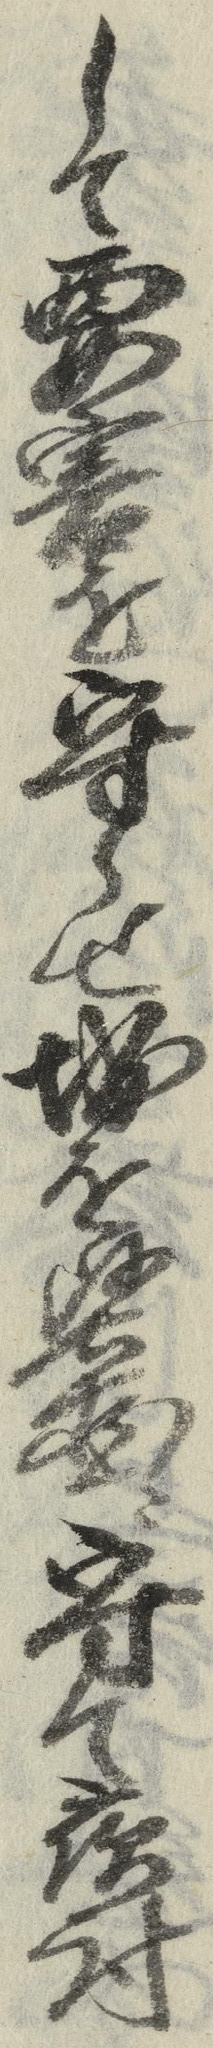して要害を守らせ城を堅置に守て夜討
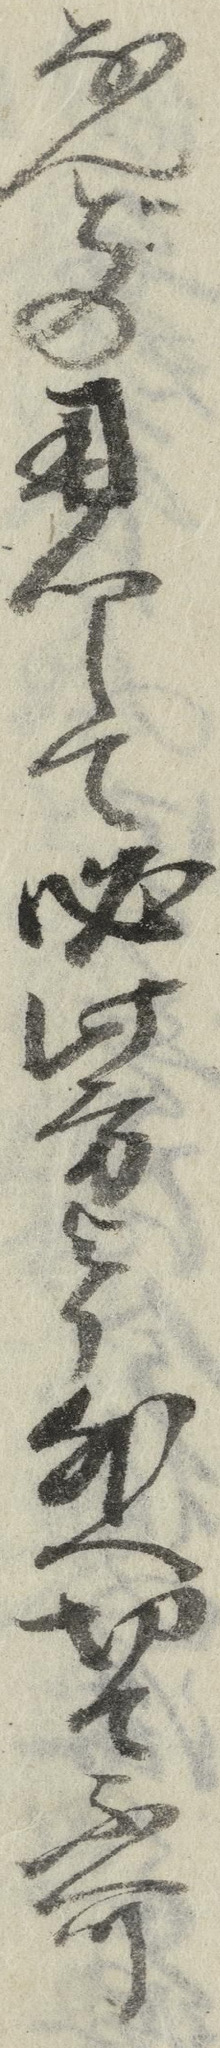なんどの用心して必此方より外へ切てふ可
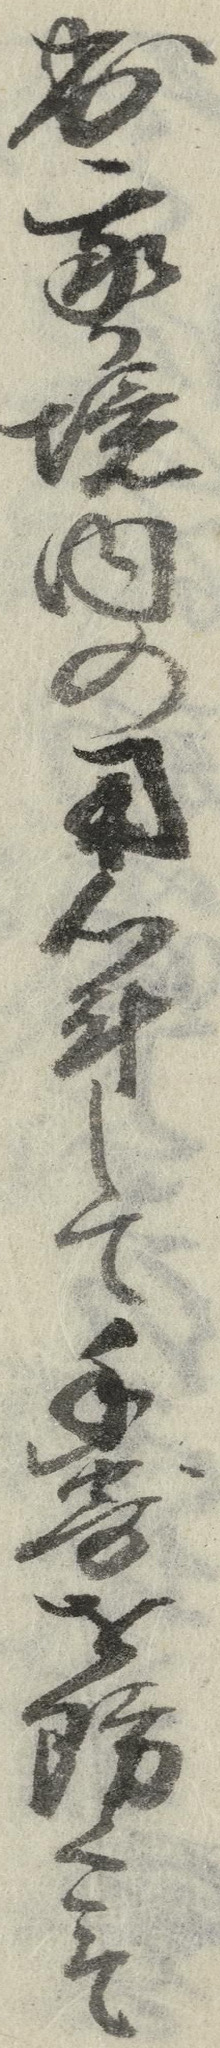出我か境内の用心計して手寄を防くこそ
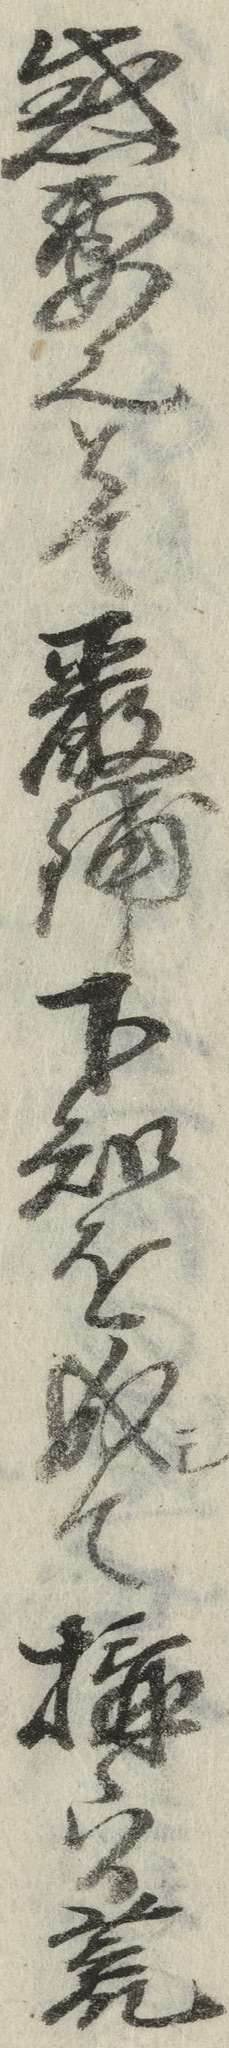感要也とて厳鋪下知を成構らる荒
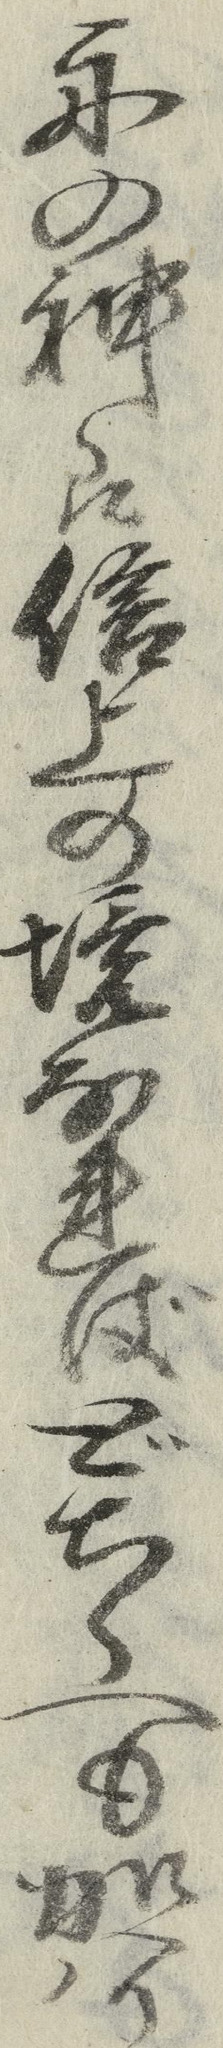舟の神ら信上の境なればどちらへも加はり
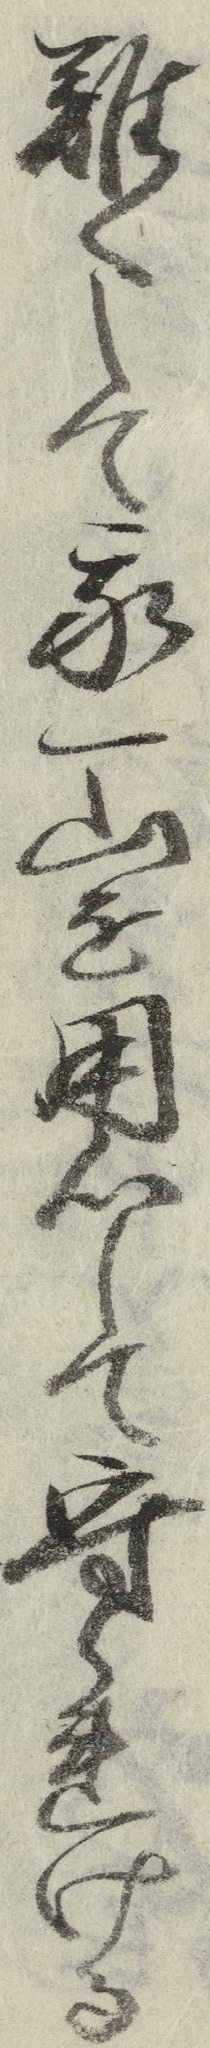難くして我一山を用心して守られける
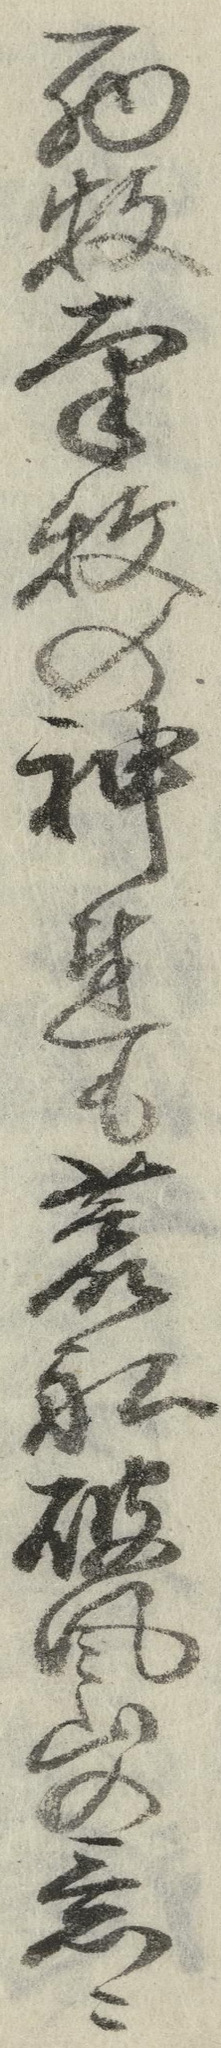西牧東牧の神達も荒舩破風山の意に
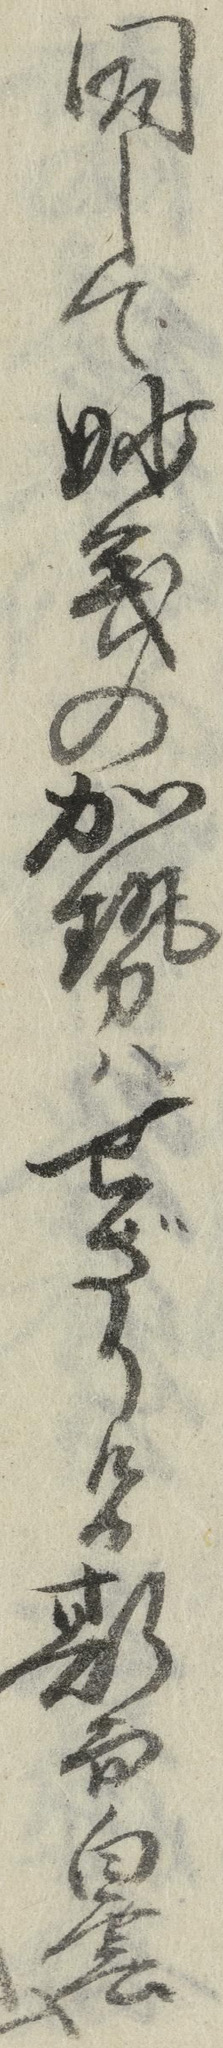同して妙義の加勢はせざりける斯而白雲山

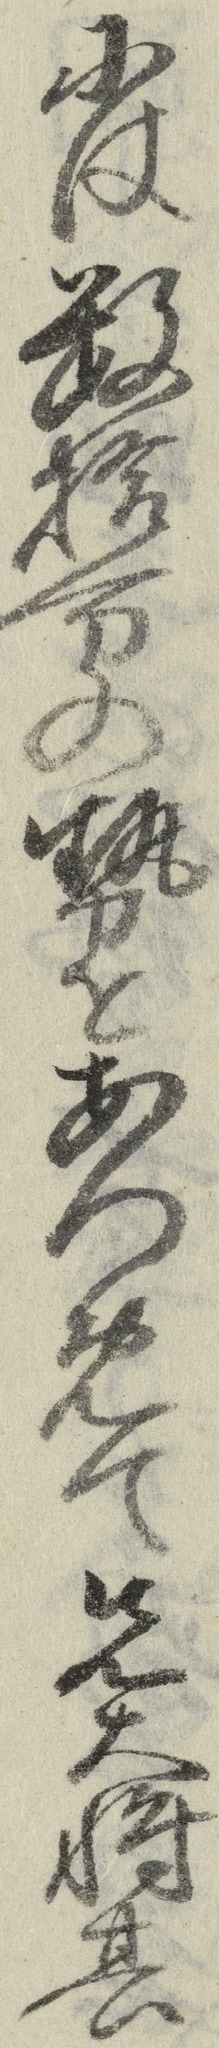には数拾万の勢をあつめて先大将其
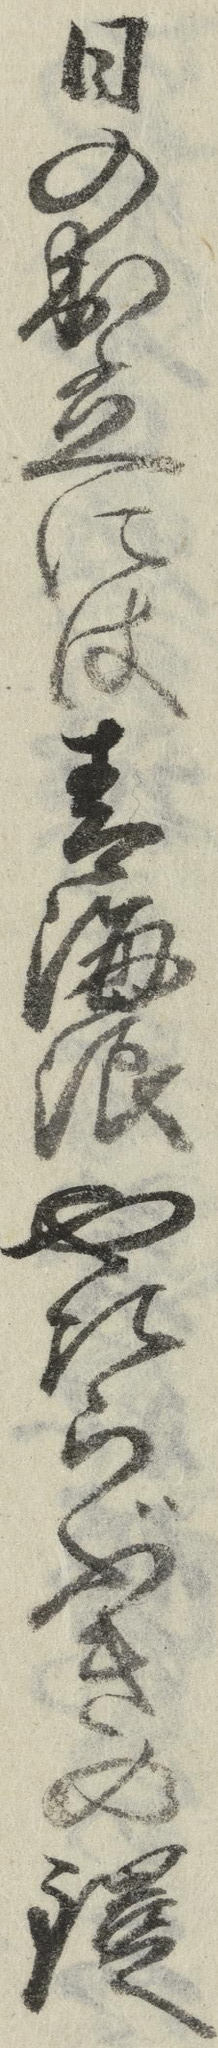日の出立には青海浪やすらぶきの鎧
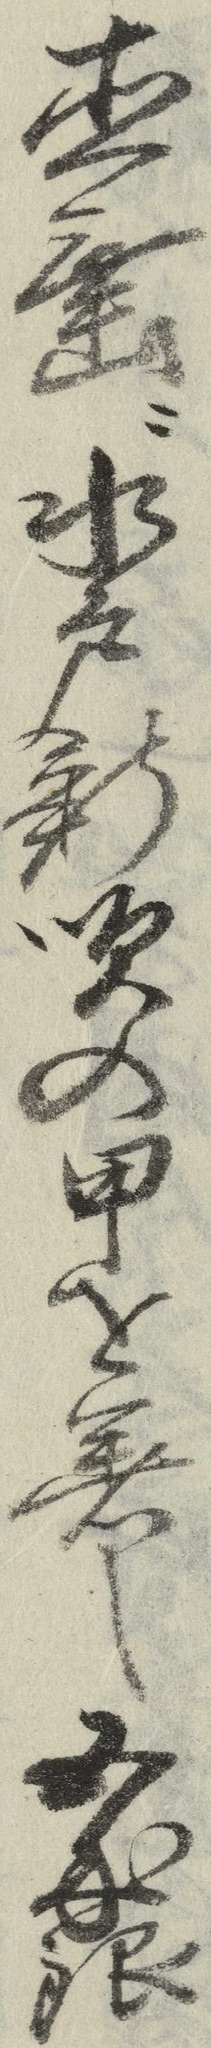直垂に水戸新唄の甲を着し五匁銀
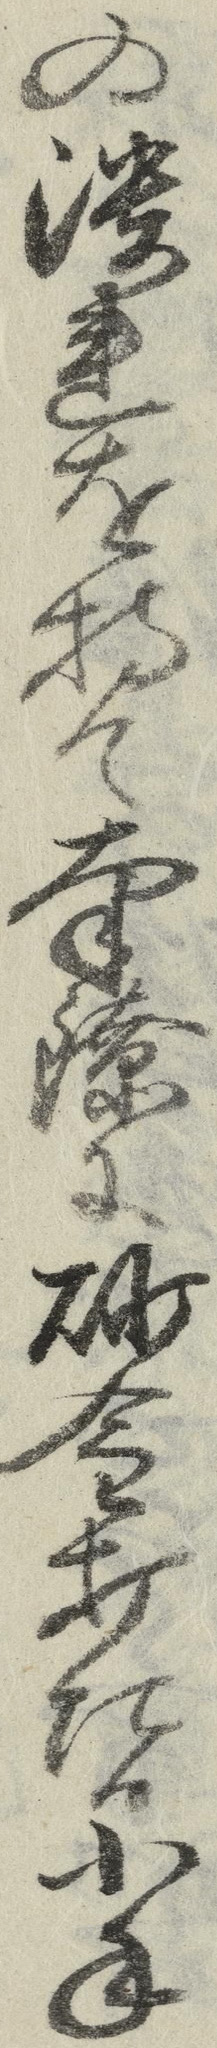の潰れを持て東に砂金打たる小手
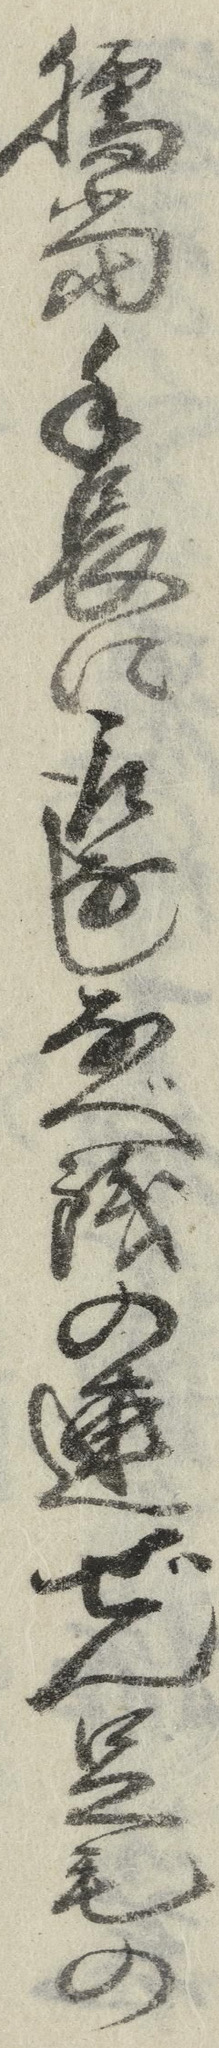臑当手長に取なしなべ銭の連ぜん足毛の
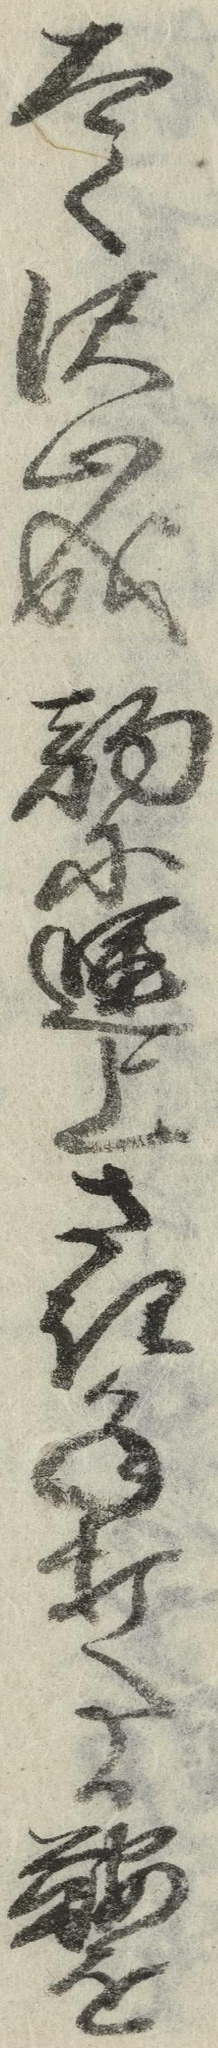太く沢山成駒に運上さきかね打たる鞍を
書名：浅間大焼騒動記　上
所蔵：東京大学地震研究所図書室 Earthquake Research Institute Library, The University of Tokyo, JAPAN
